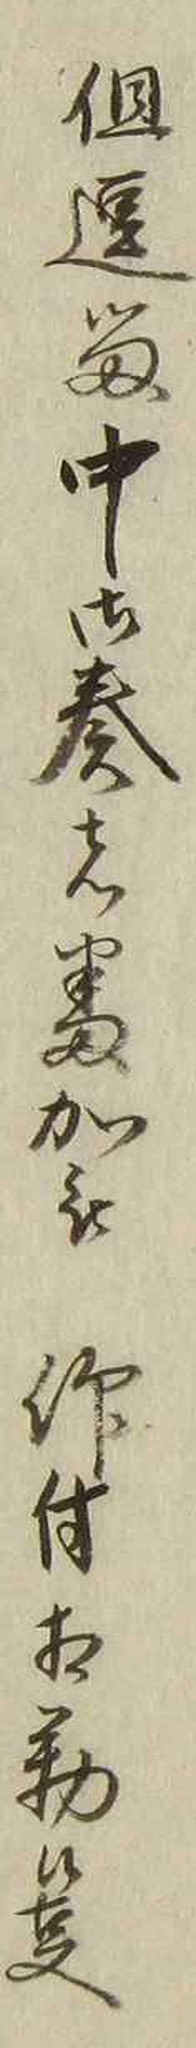但逗留中御奏者番加被仰付相勤候事
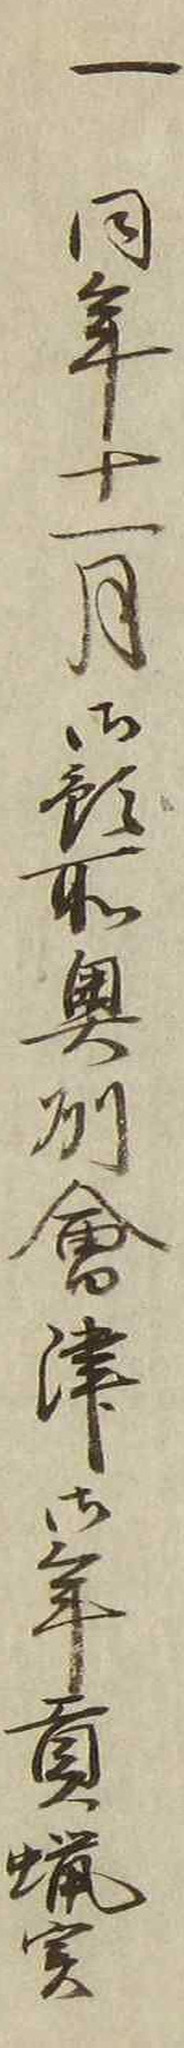一同年十一月御預所奥州会津御年貢蝋実

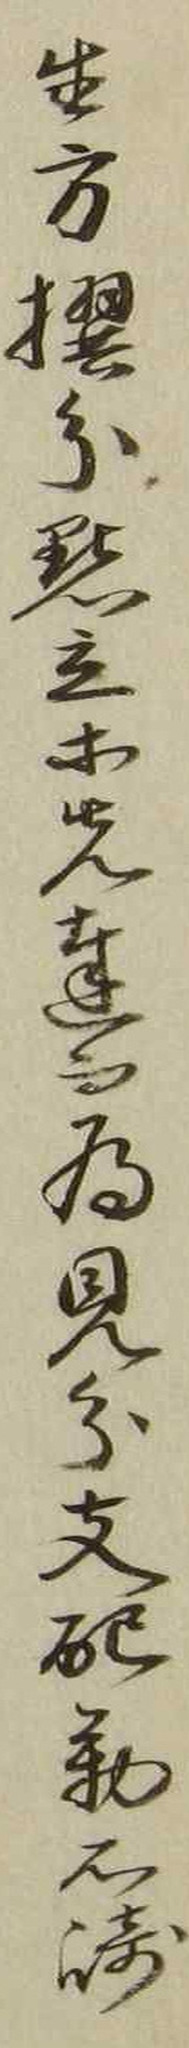生方撰分黙立等先達而為見分支配勤石崎
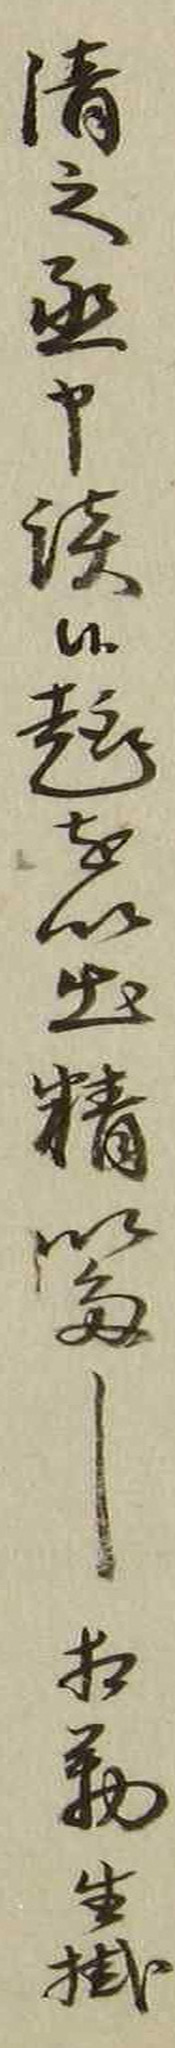清之丞申談候趣を以出精いたし相勤生掛
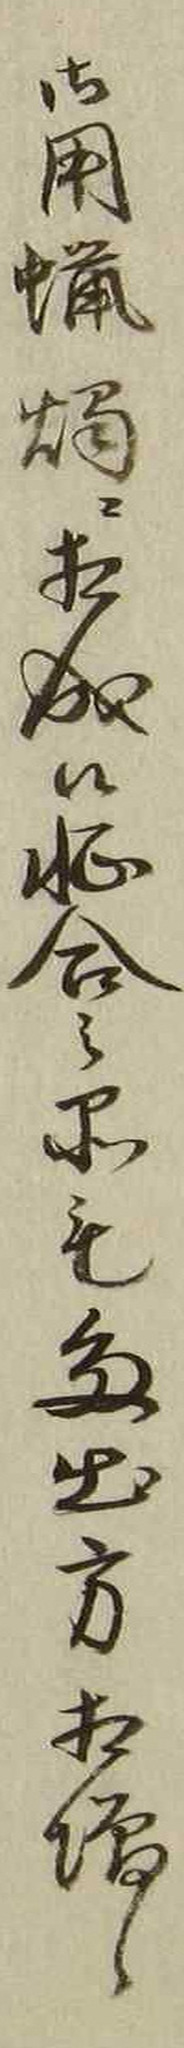御用蝋燭ニ相成候怔合之品も多出方相増候
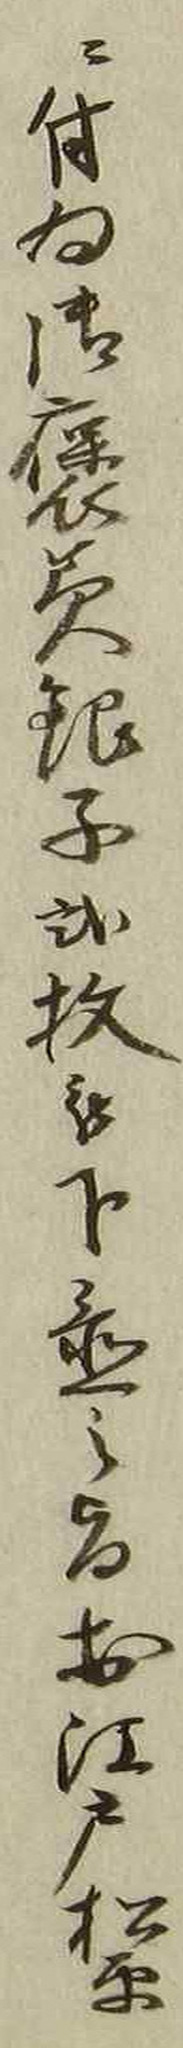ニ付為御褒美銀子弐枚被下置之旨於江戸松平
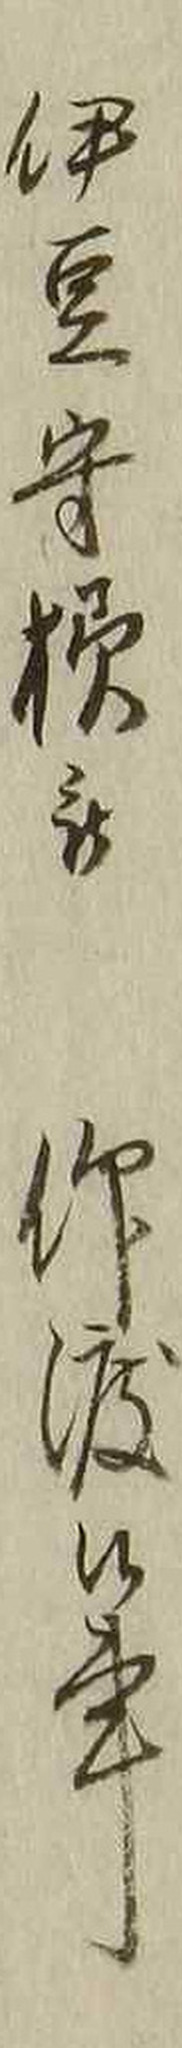伊豆守様被仰渡候事
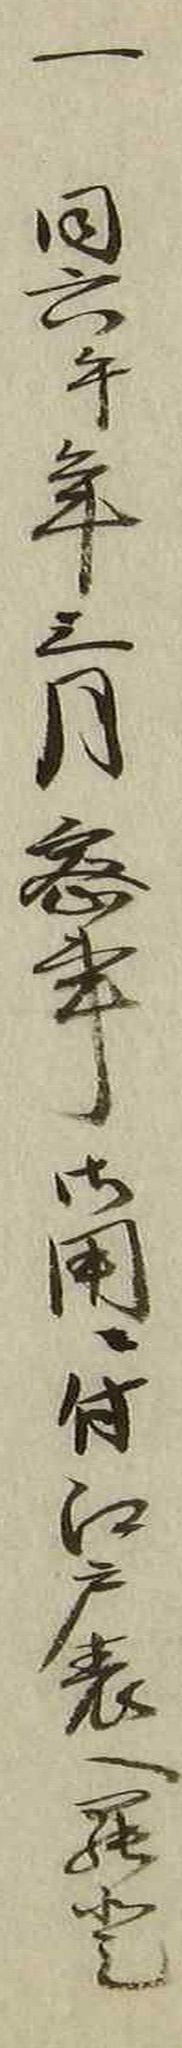一同六午年三月密事御用ニ付江戸表へ罷登
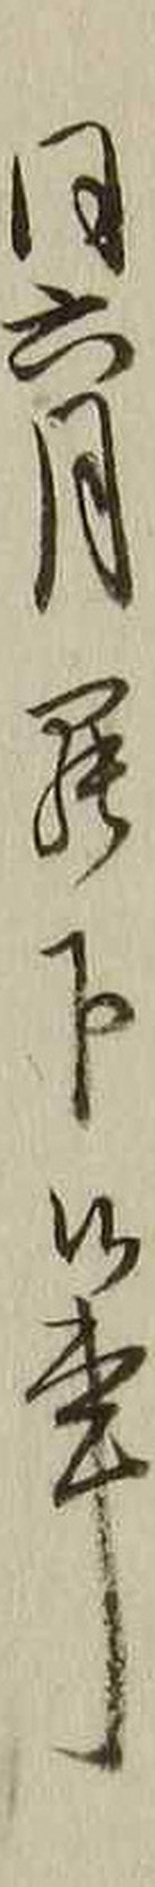同六月罷下候事
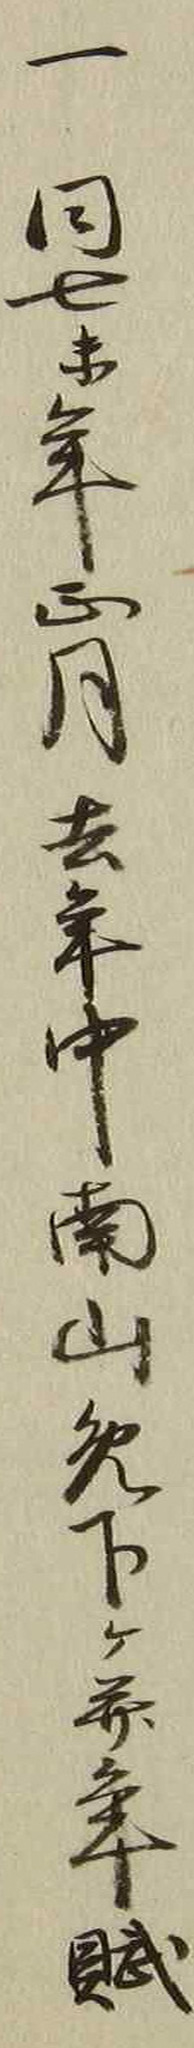一同七未年正月去年中南山免下ケ幷年賦
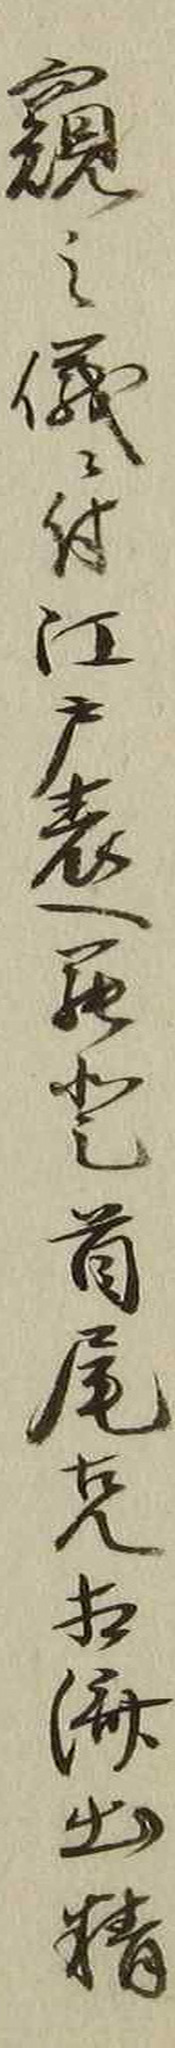窺之儀ニ付江戸表へ罷登首尾克相済出精
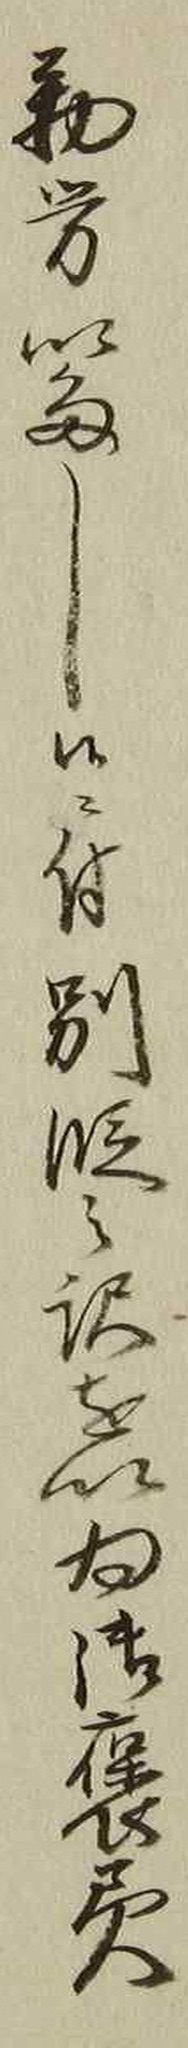勤労いたし候ニ付別段之訳を以為御褒美
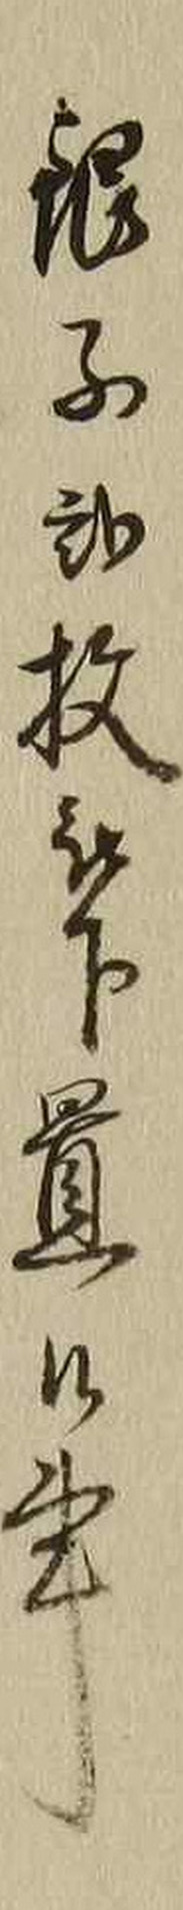銀子弐枚被下置候事
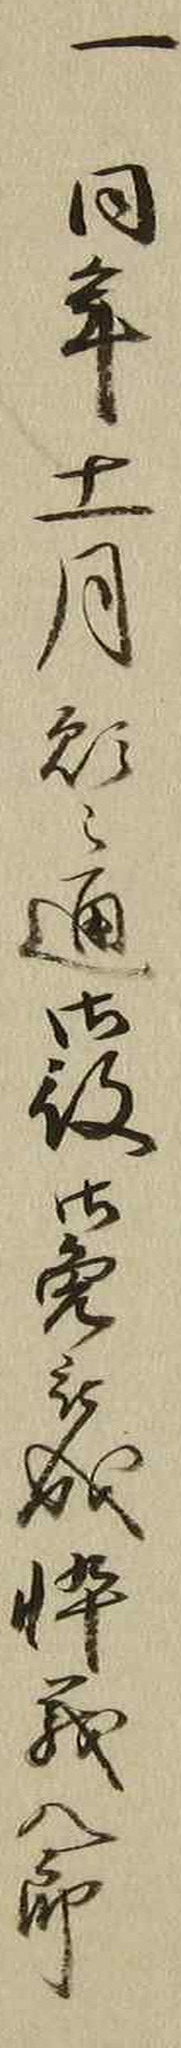一同年十一月願之通御役御免被成忰義八郎
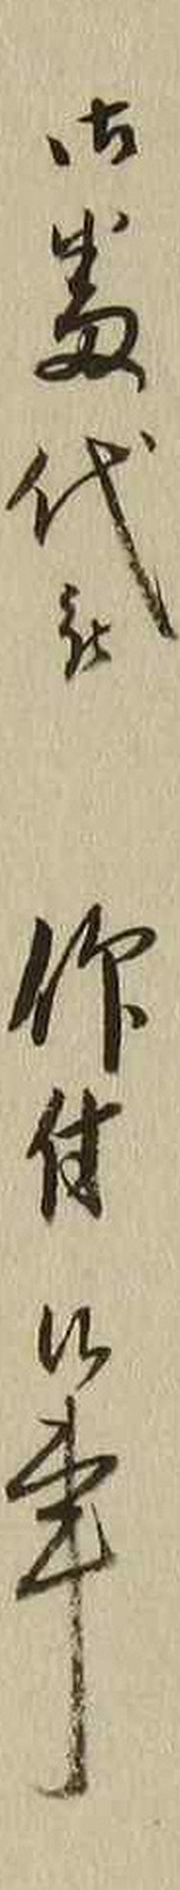御番代被仰付候事
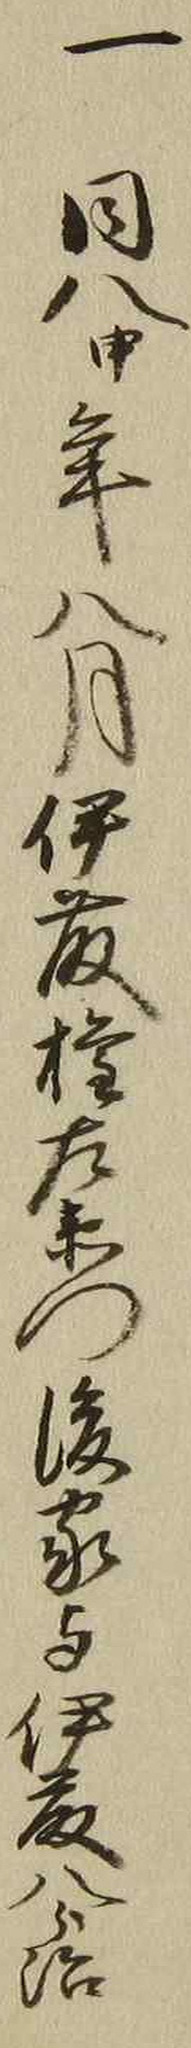一同八申年八月伊藤権左衛門後家与伊藤八郎治
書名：諸士系譜　巻之128　た之部4
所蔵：会津若松市立会津図書館
